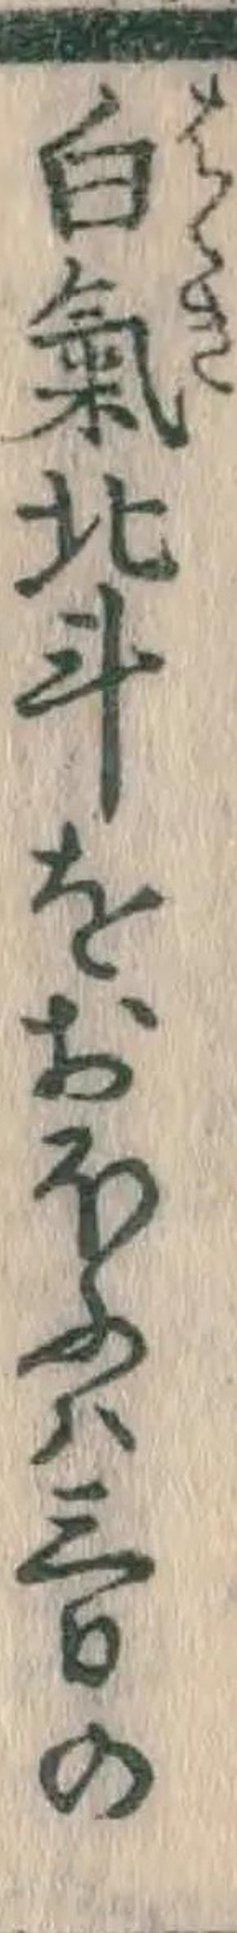白気北斗をおほふは三日の
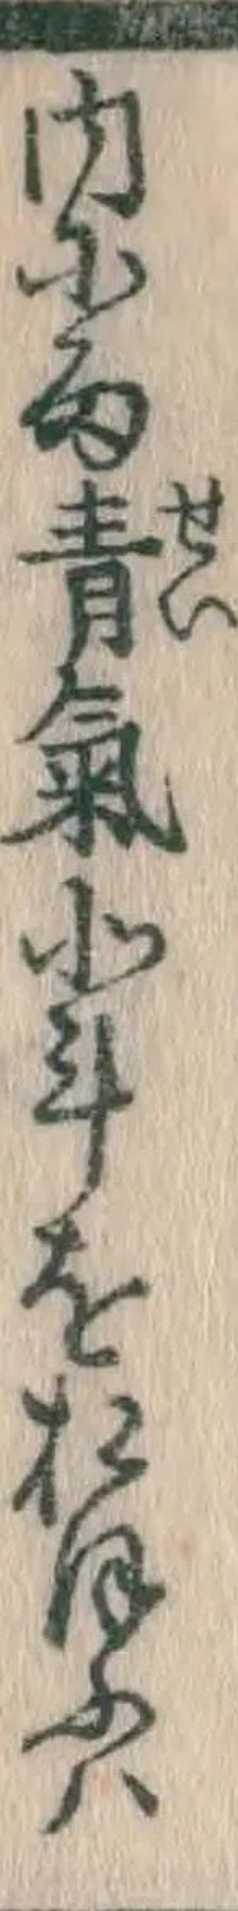内に雨青気北斗をおほふは
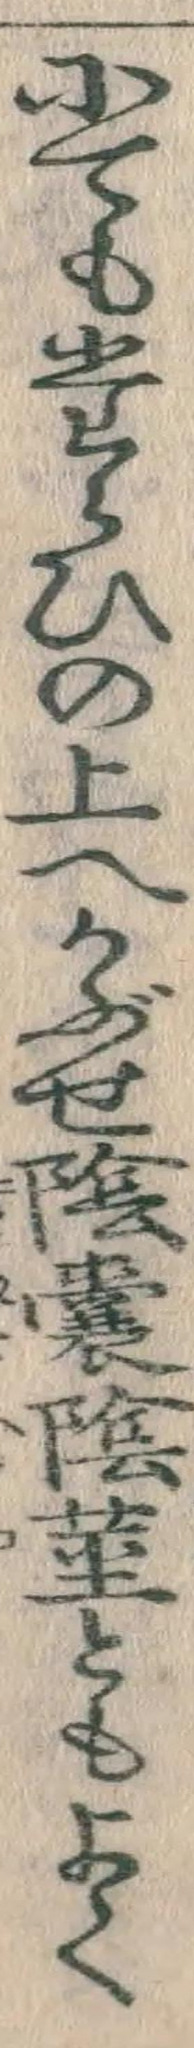にてもたらひの上へかぶせ陰嚢陰茎ともよく
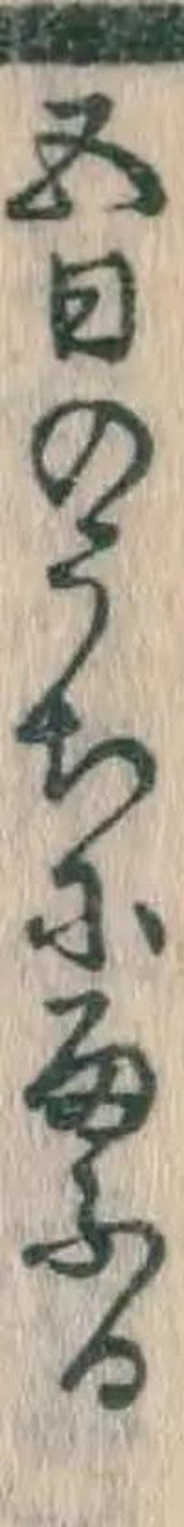五日のうちに雨ふる
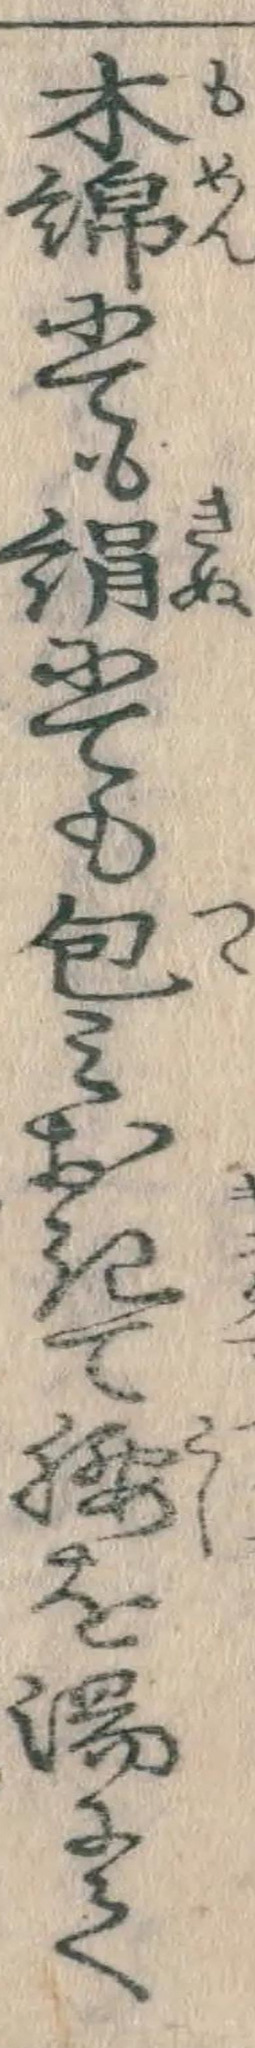木綿にても絹にても包みおきて腰を湯にて
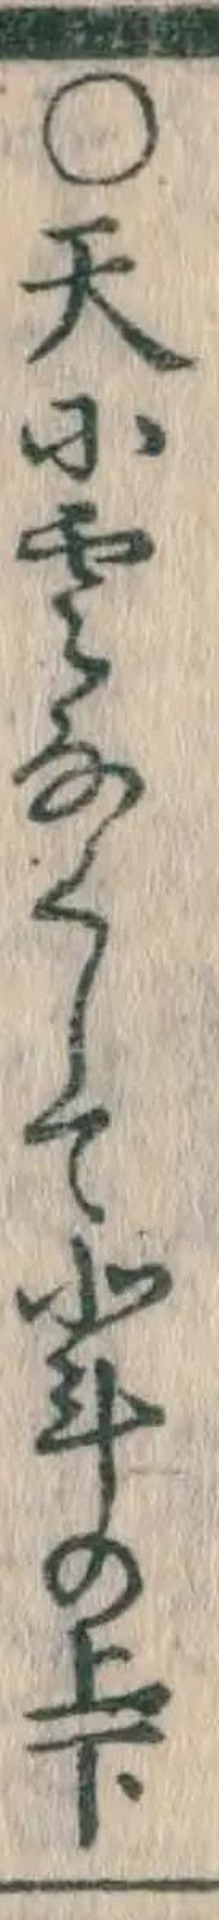○天に雲なくして北斗の上下
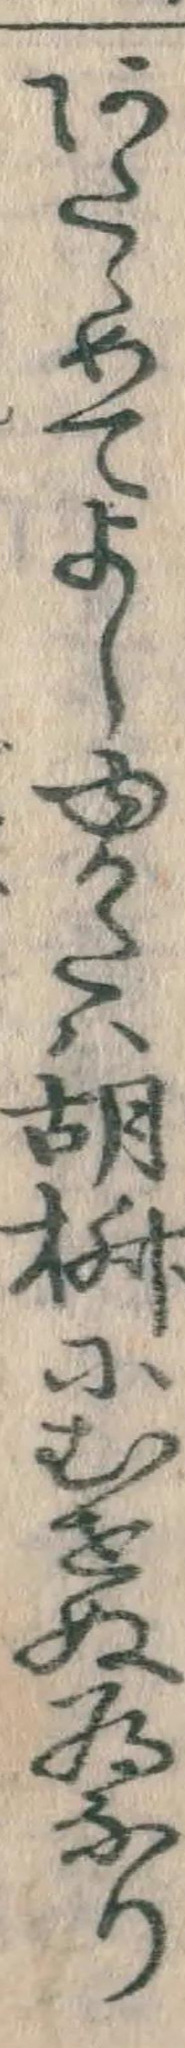あたゝめてよしゆかたは胡桝にむせぬ為なり
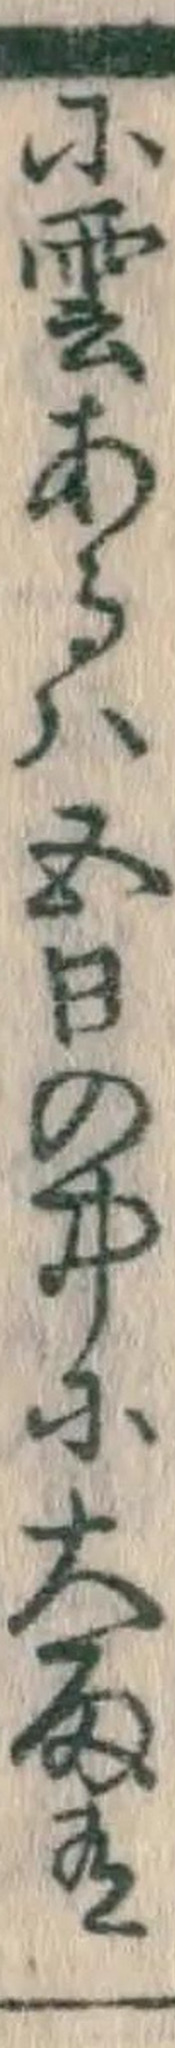に雲あるは五日の中に大雨有
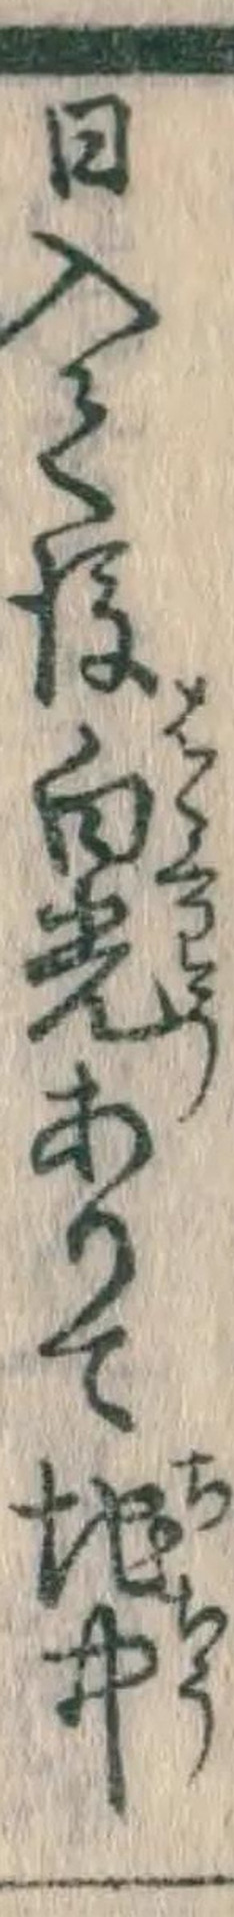日入て後白光ありて地中
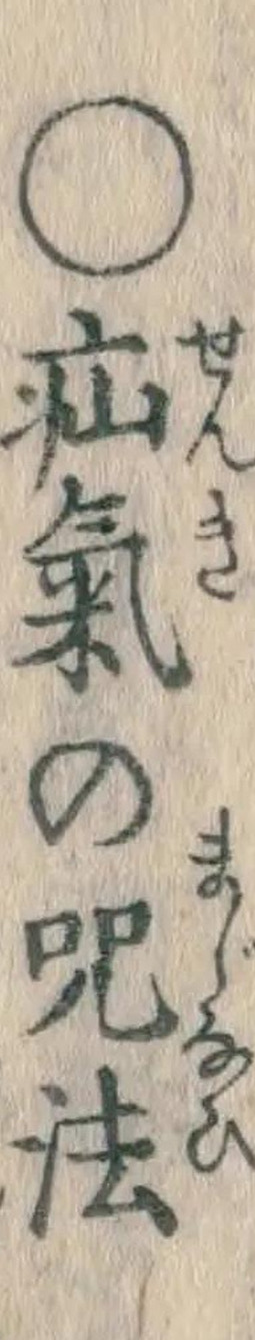○疝気の呪法
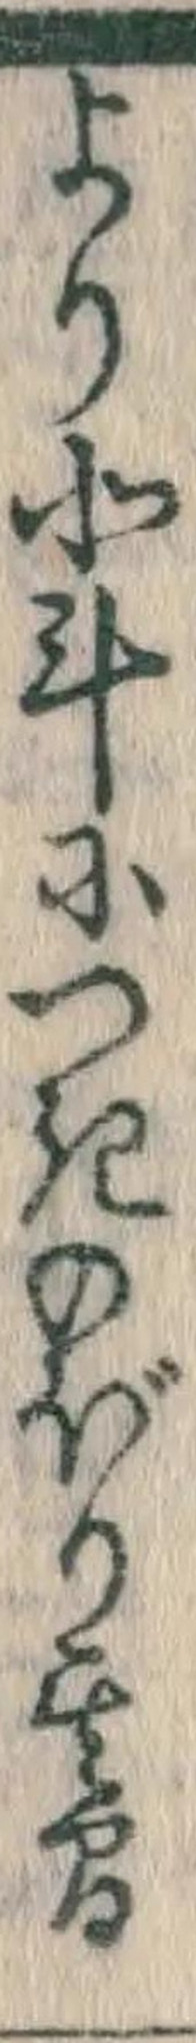より北斗につきのぼり其間
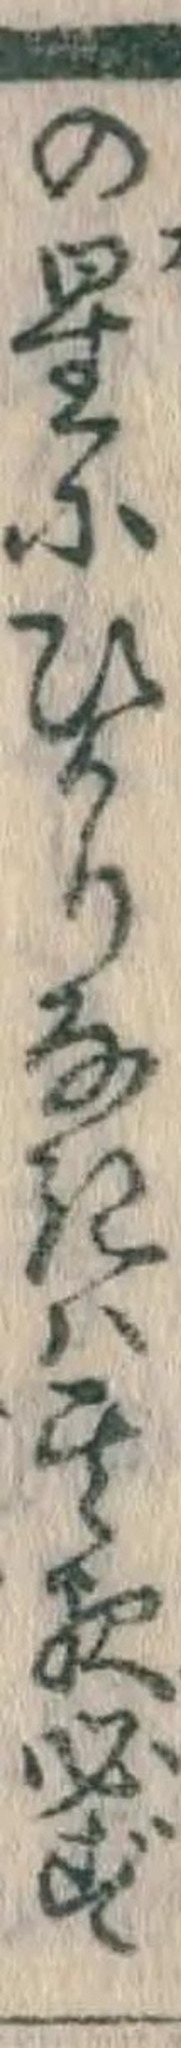の星にひかりなきは其夜必ず
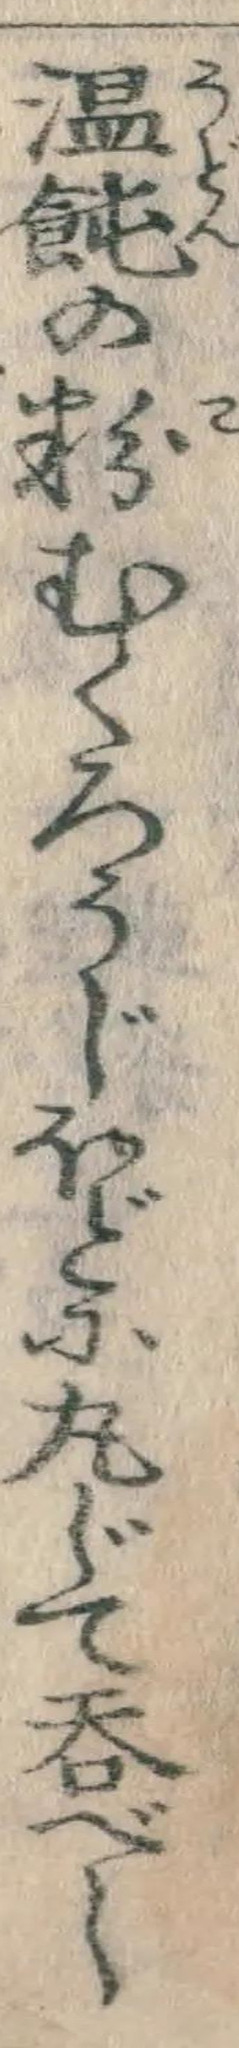温飩の粉むくろうじほどに丸じて呑べし
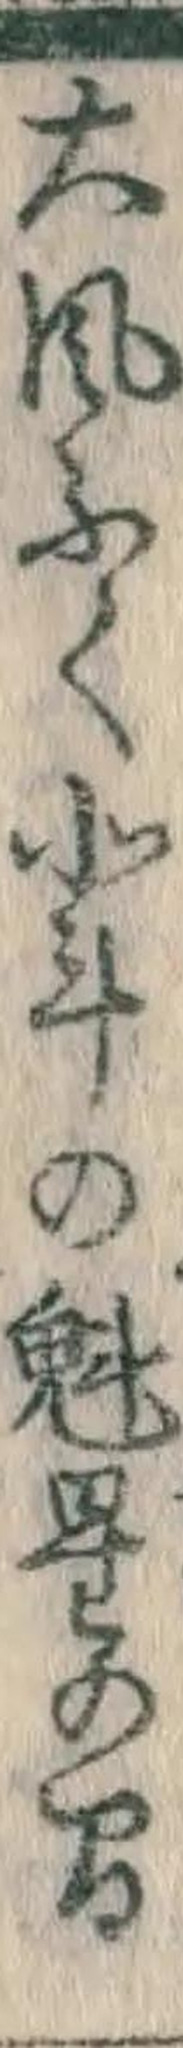大風ふく北斗の魁星の間
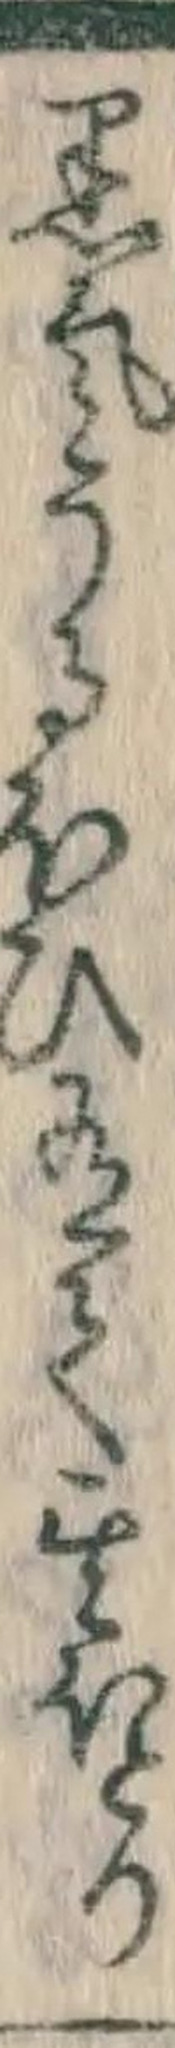黒気うるほひ有て其ほとり
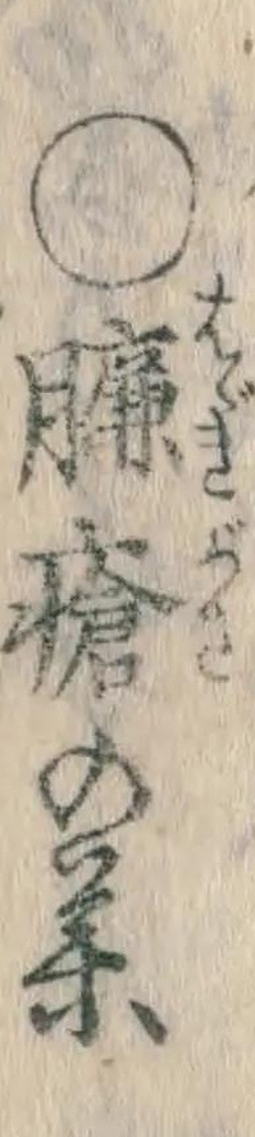○臁瘡の薬
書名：広益秘事大全 3巻. [4]
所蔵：国立国会図書館 National Diet Library, JAPAN
